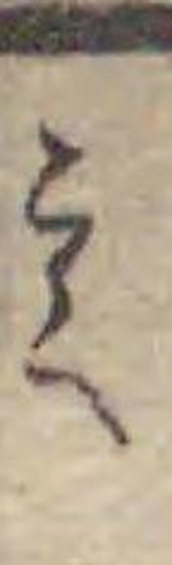こゝへ
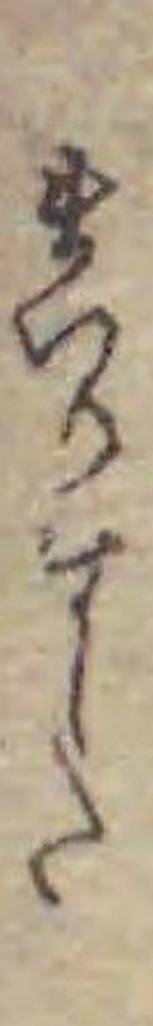まいりました

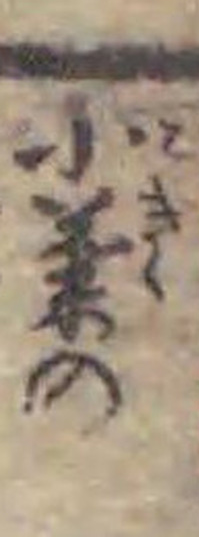小菊の
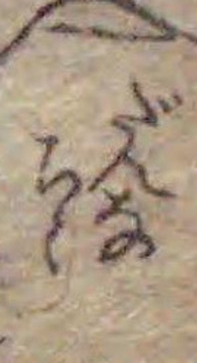だんな
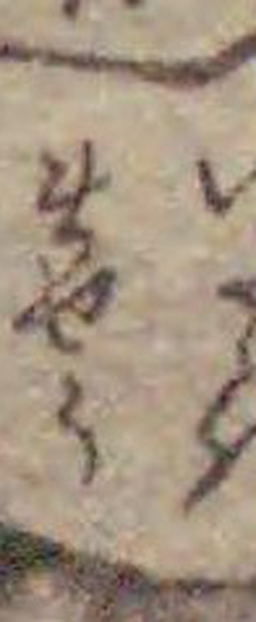ませう
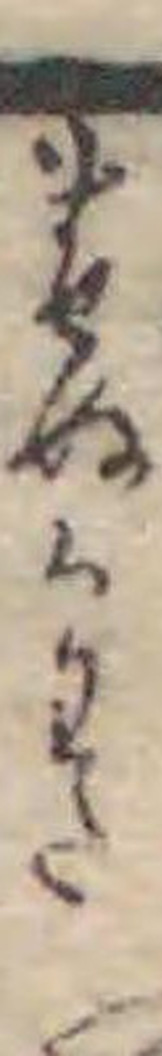ませぬかわた
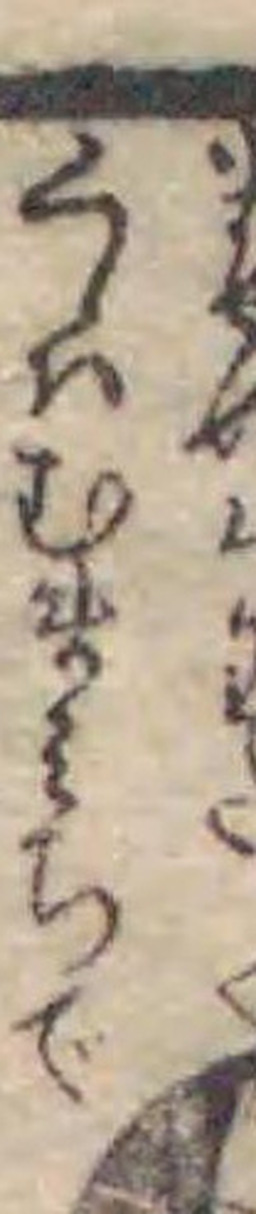くしはむまみちで
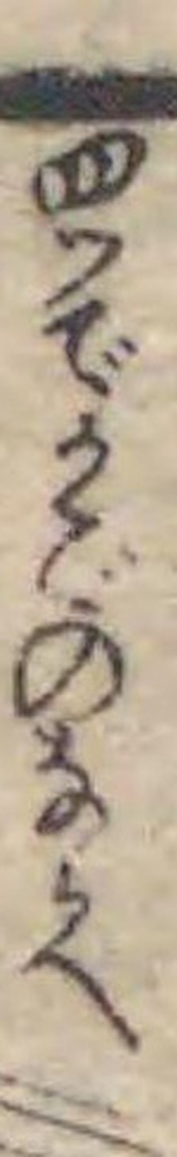四ツでかごのなかへ
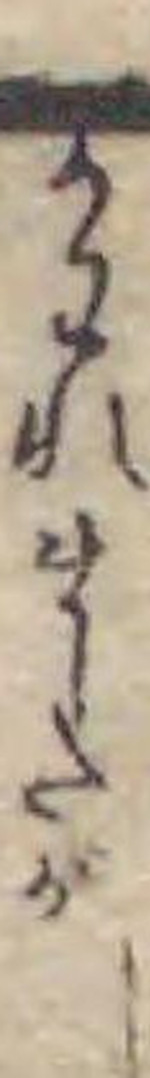かわれましたが
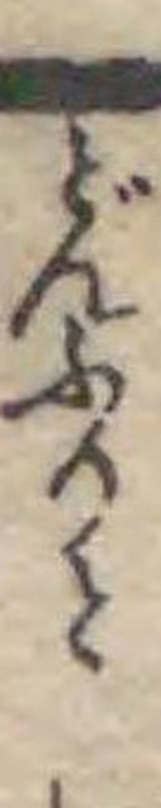どんふりと
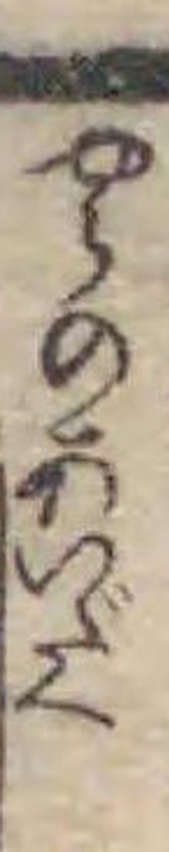やらのあいだへ
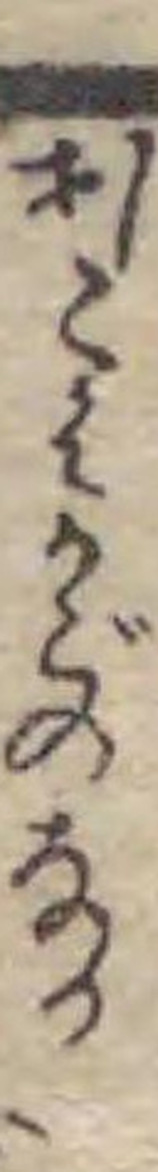おしこみかごのなか
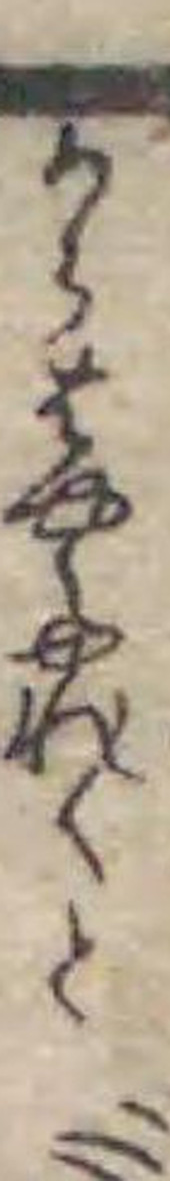からはやうやれ〳〵と
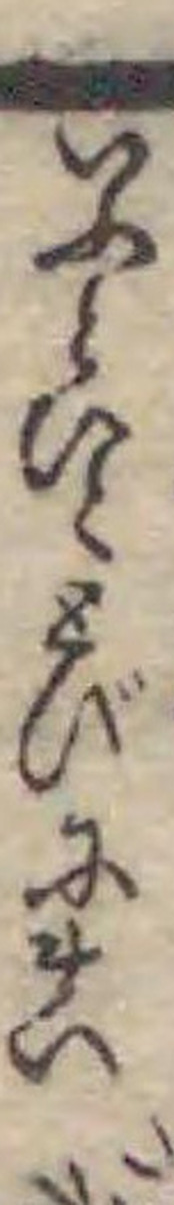いふとひととびにまい
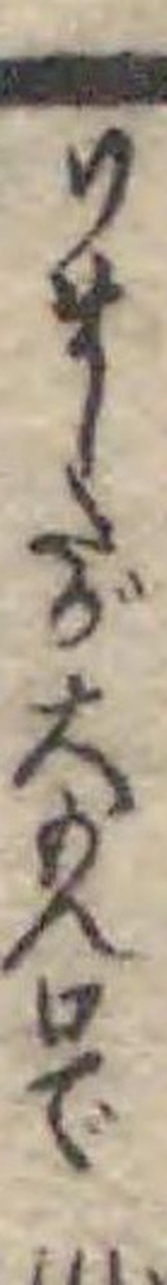りましたが大もん口で
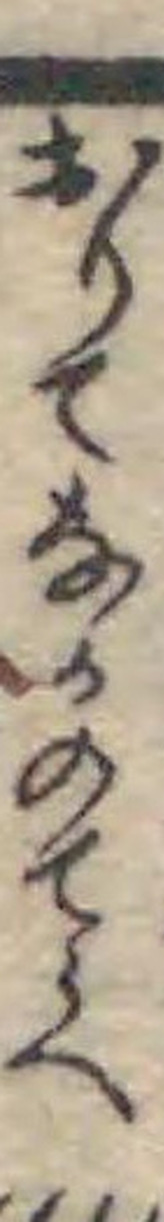おりてなかのてうへ
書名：紙屑身上噺 : 3巻
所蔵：国立国会図書館 National Diet Library, JAPAN
